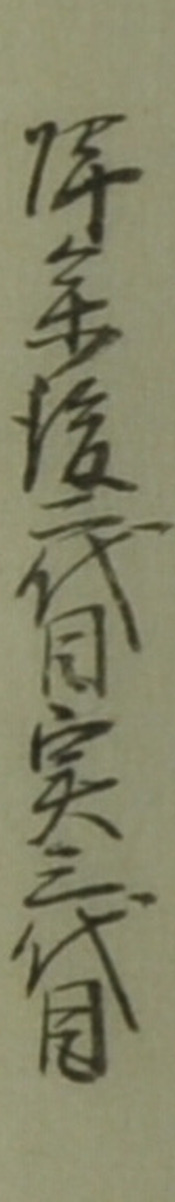帰参後二代目実三代目

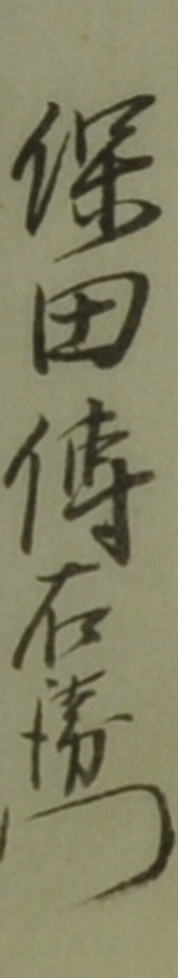保田伝右衛門
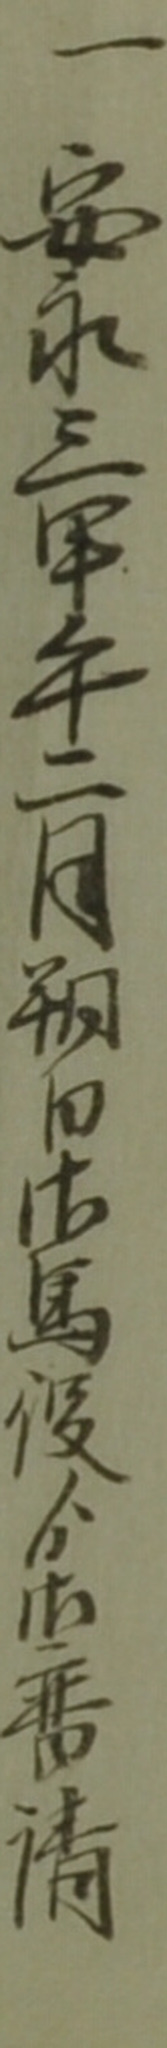一安永三甲午二月朔日御馬役ゟ御普請
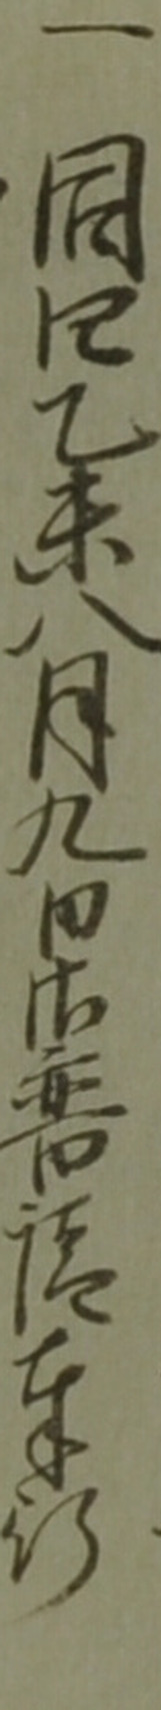一同四乙八月九日御普請奉行
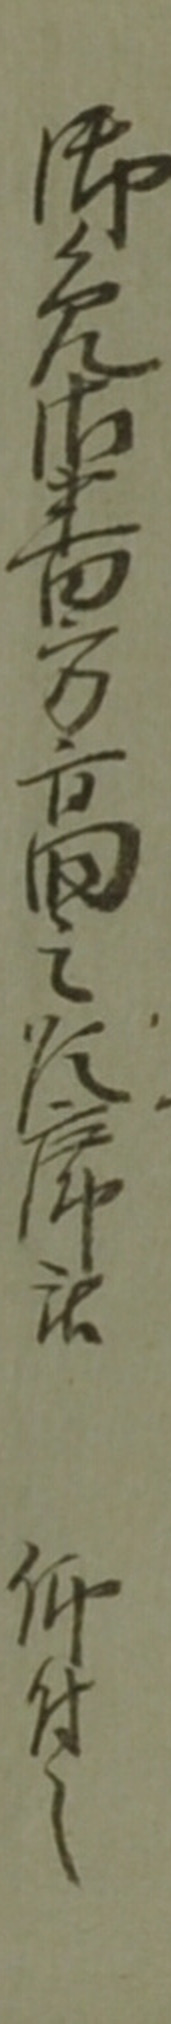御免御番方高之次席被仰付之
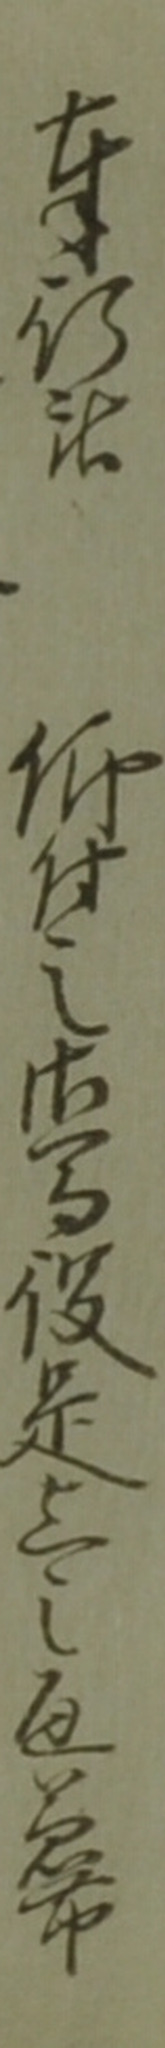奉行被仰出之御役是迄之通兼帯
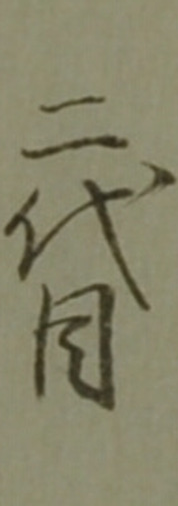二代目
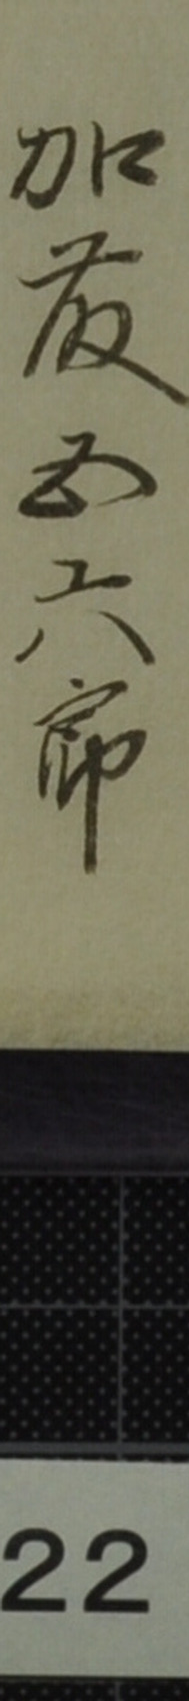加藤五六郎
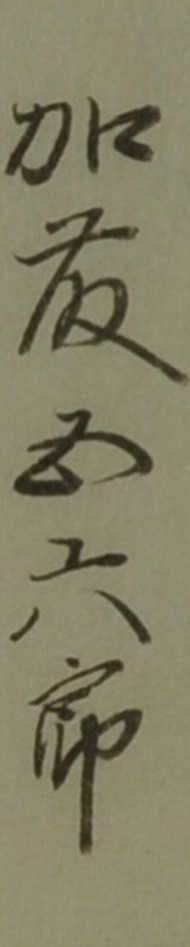加藤五六郎
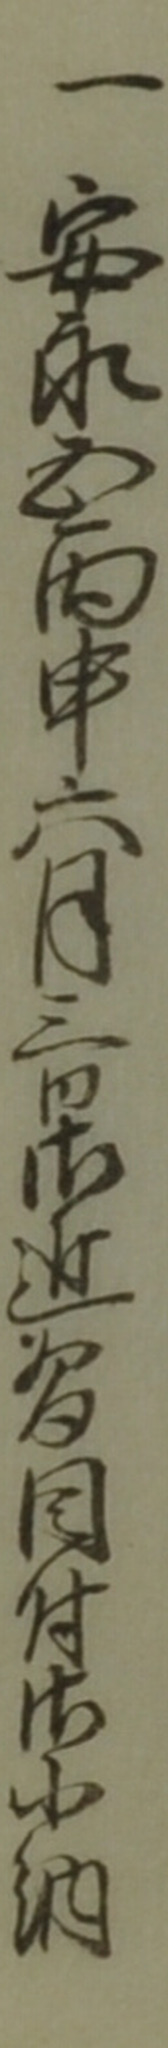一安永五丙申六月三日御近習同付御小納
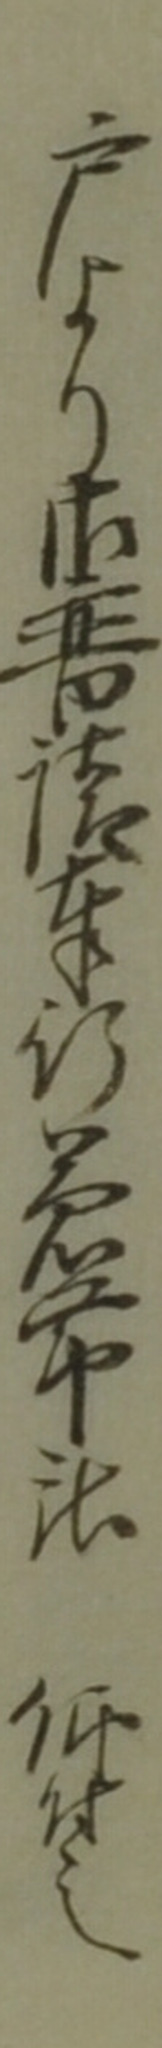戸より御普請奉行兼帯被仰付之
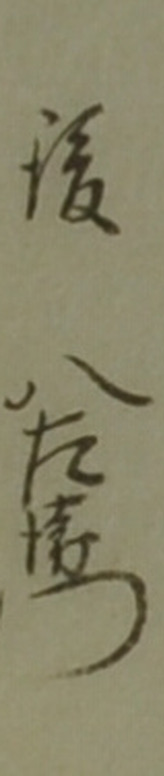後八左衛門
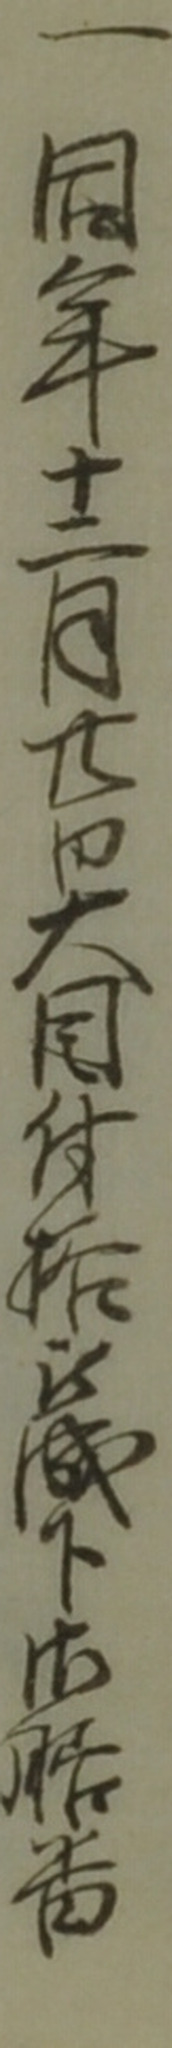一同年十二月廿日大目付格被成下御膳番
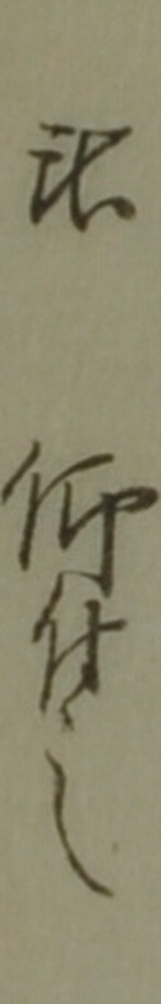被仰付之
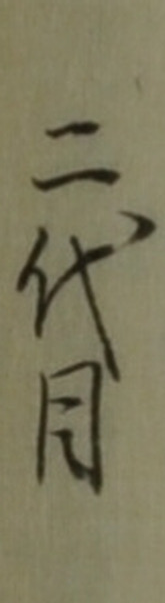二代目
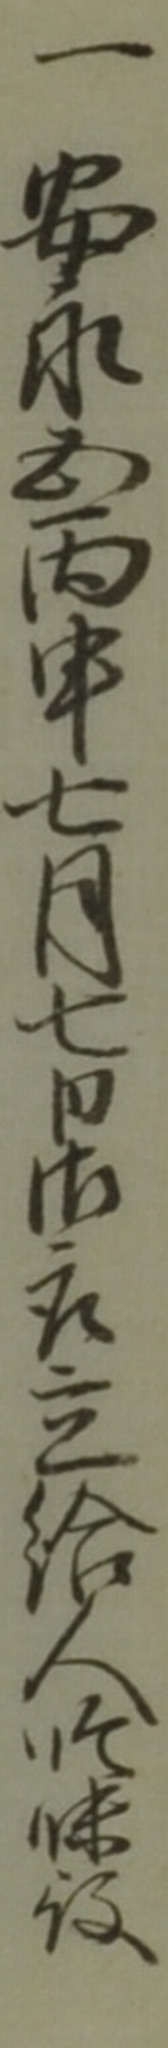一安永五丙申七月七日御取立給人吟味役
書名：諸御役代々録（六）
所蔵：伊那市立高遠町図書館・合同会社AMANE
